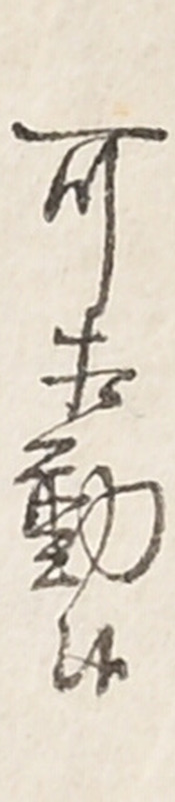可相勤候
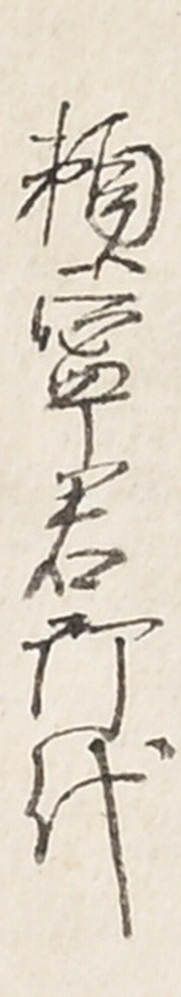頼寧君御代
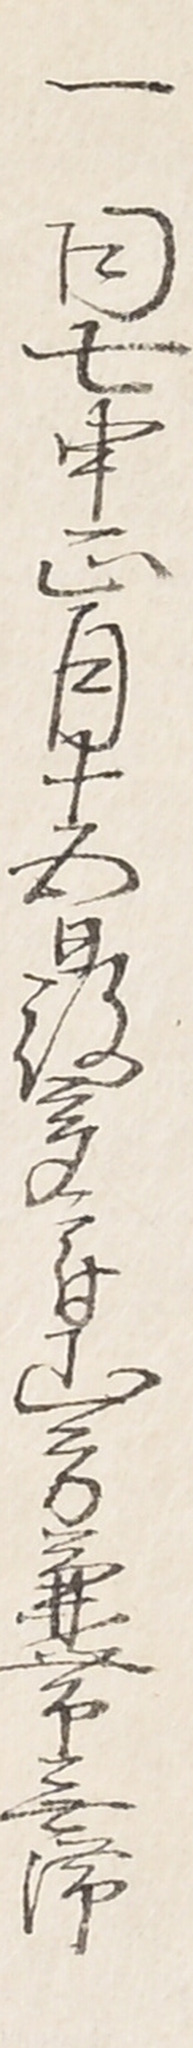一同七申正月十五日役多ニ付山方兼帯無滞
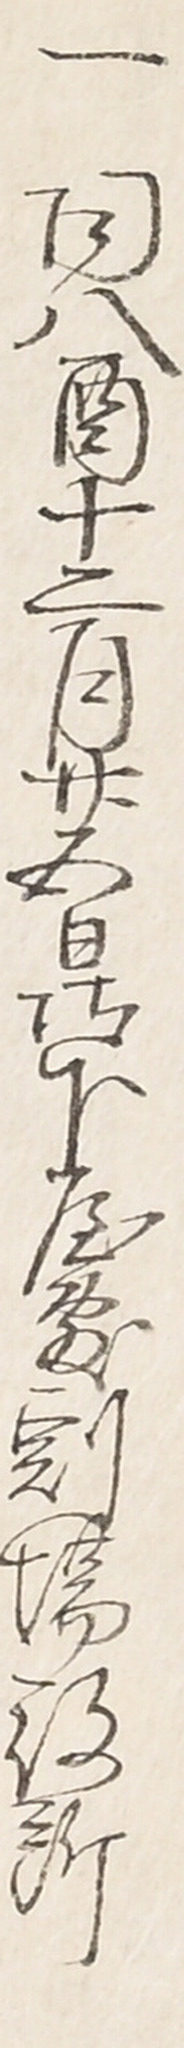一同八酉十二月廿五日御下屋敷割場役所
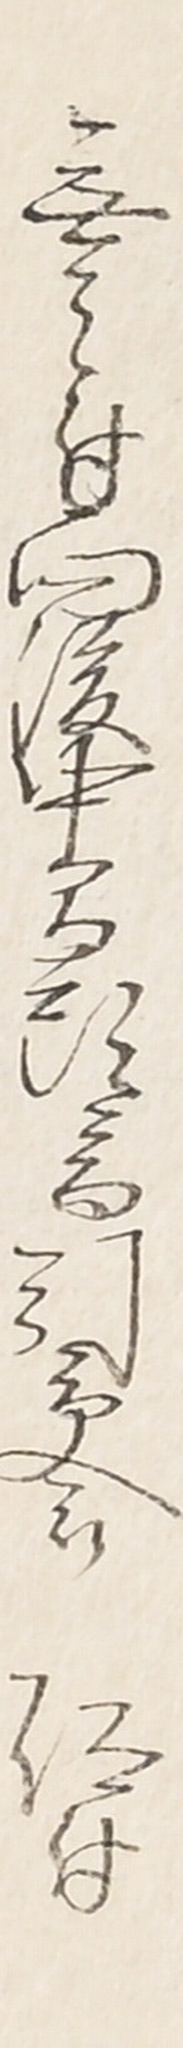無之付向後中間頭ニ而引受被仰付
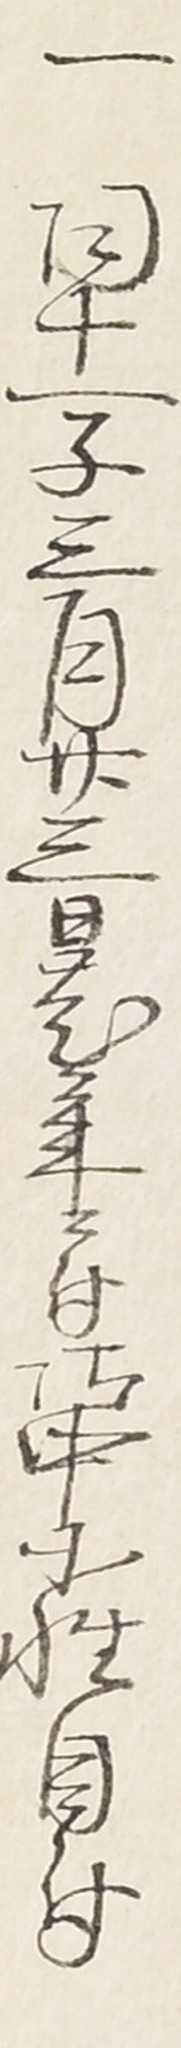一同十一子三月廿三日老年ニ付御中小性目付
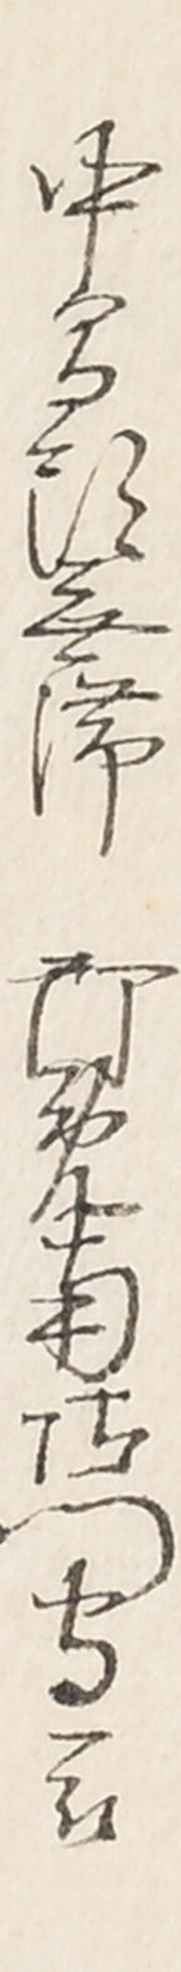中間頭無滞御免南御門守被
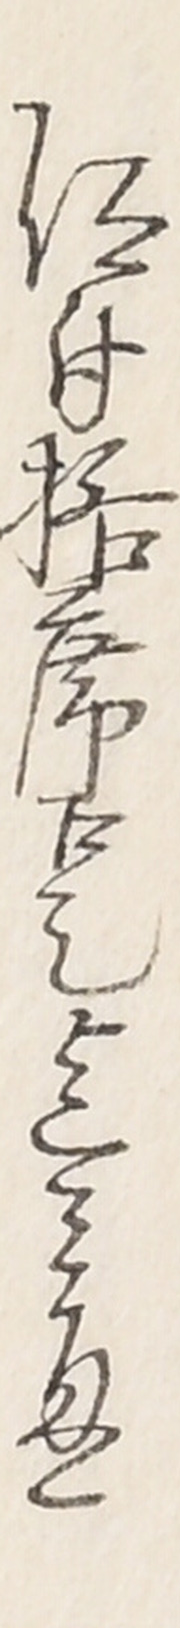仰付格席是迄之通
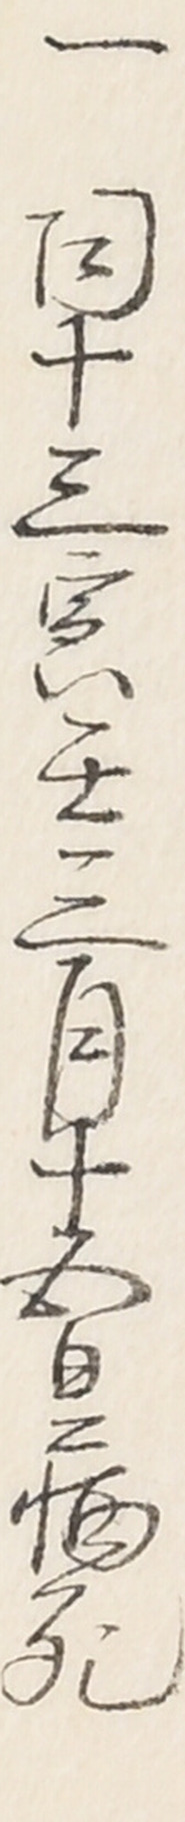一同十三寅閏三月十五日病死
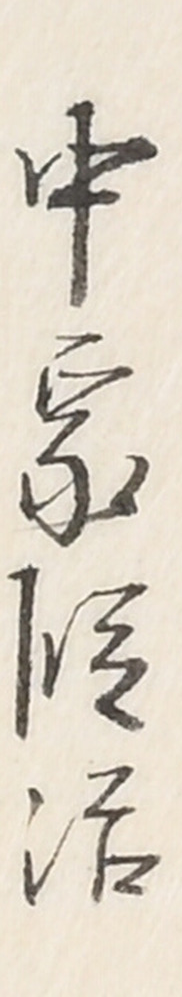中家段治
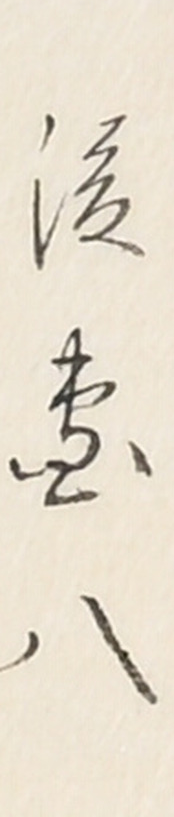後団八
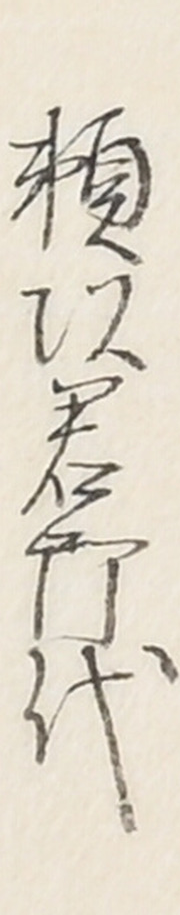頼以君御代
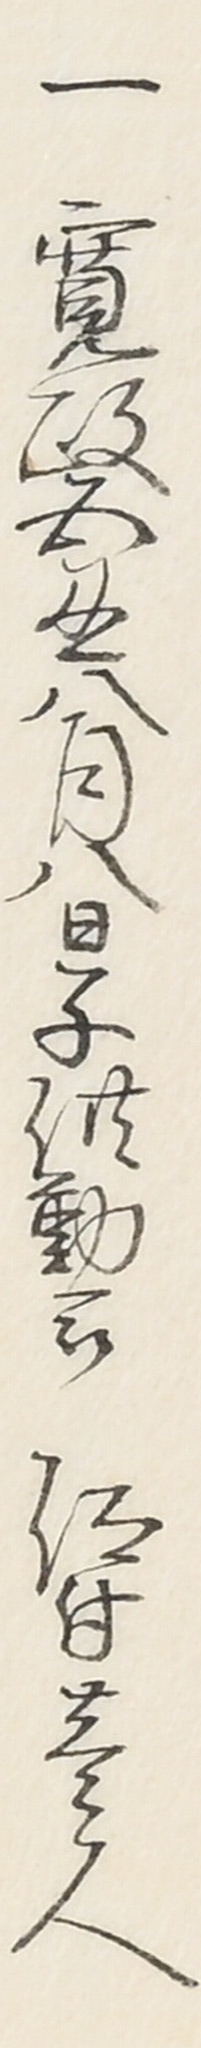一寛政五丑八月八日子供勤被仰付壱人
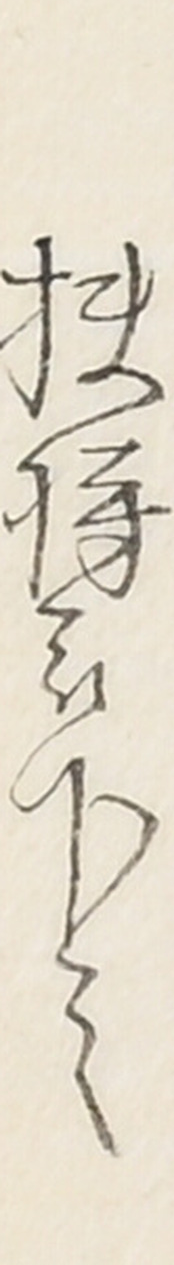扶持被下之
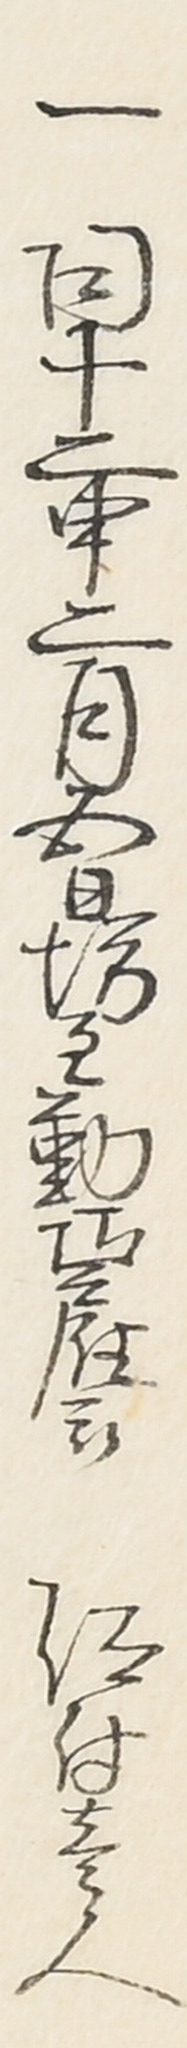一同十二申二月五日坊主勤御雇被仰付壱人
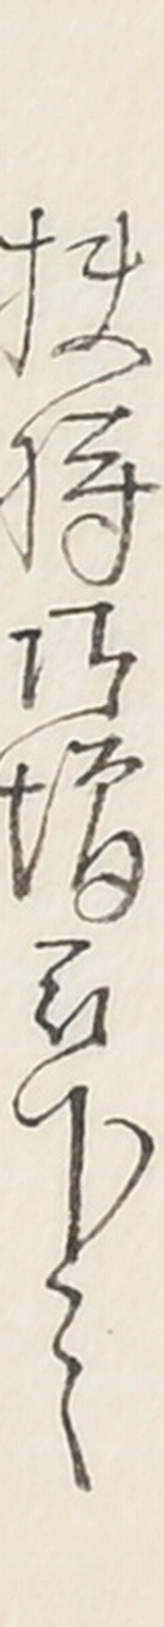扶持御増被下之
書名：無足諸士勤仕録（四）
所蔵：伊那市立高遠町図書館・合同会社AMANE
